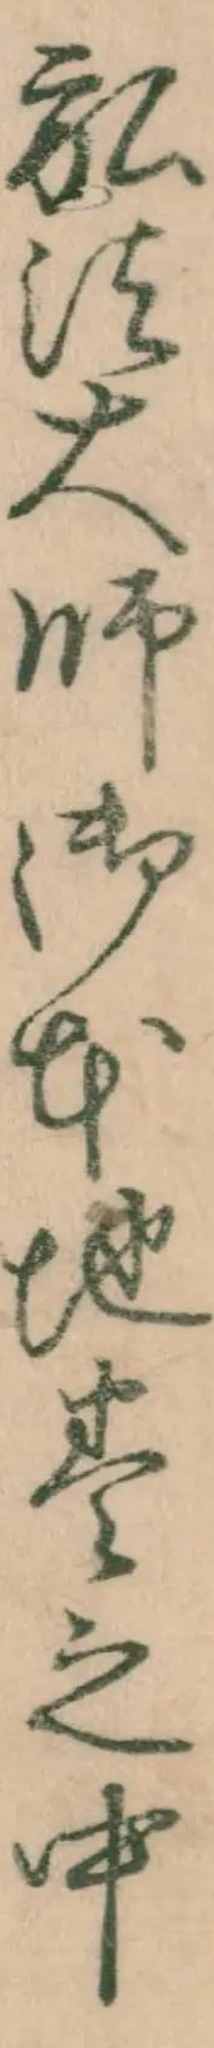弘法大師御本地巻之中
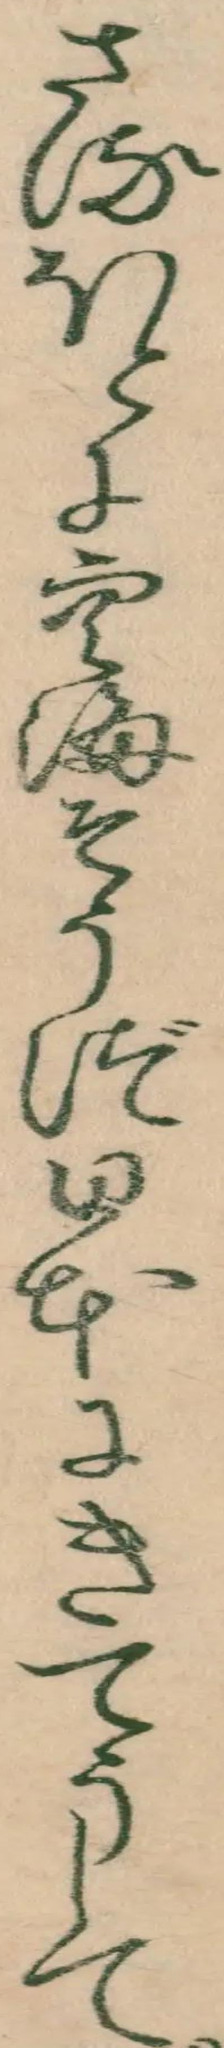さるほとに空海そうづ日本にきてうして。
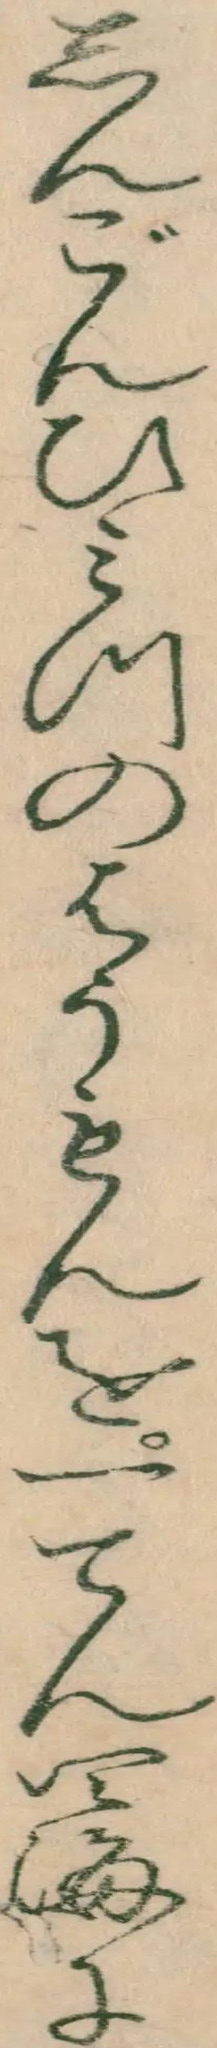しんごんひみつのほうもんを。一てん四海に
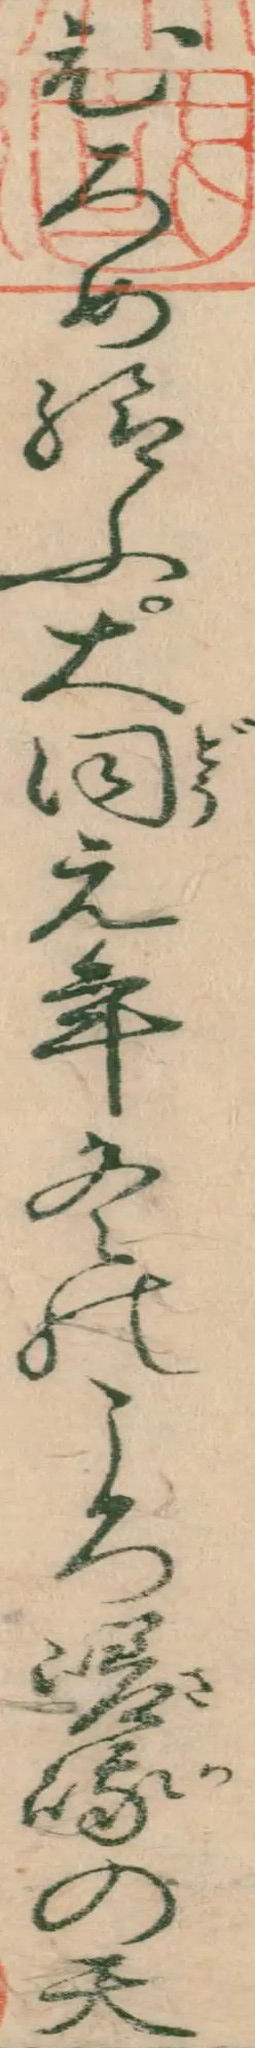ひろめ給ふ。大同元年冬のころ嵯峨の天
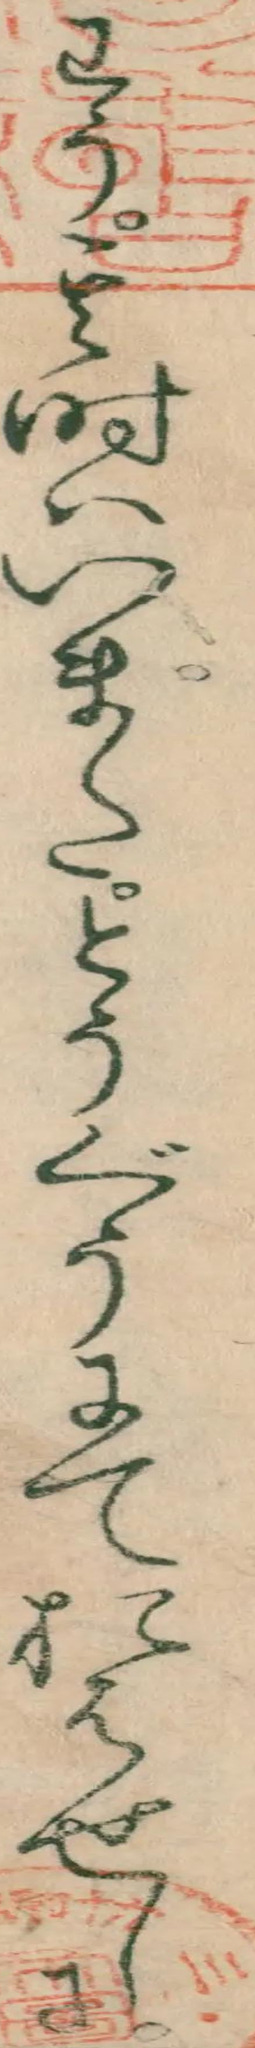わう。其時はいまた。とうぐうにておはせしに
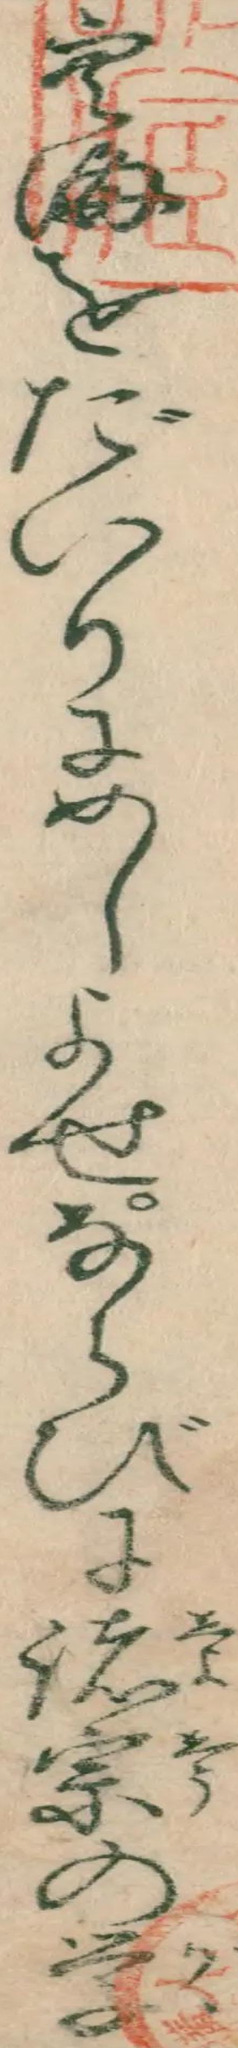空海をだいりにめしよせ。ならびに諸宗の学
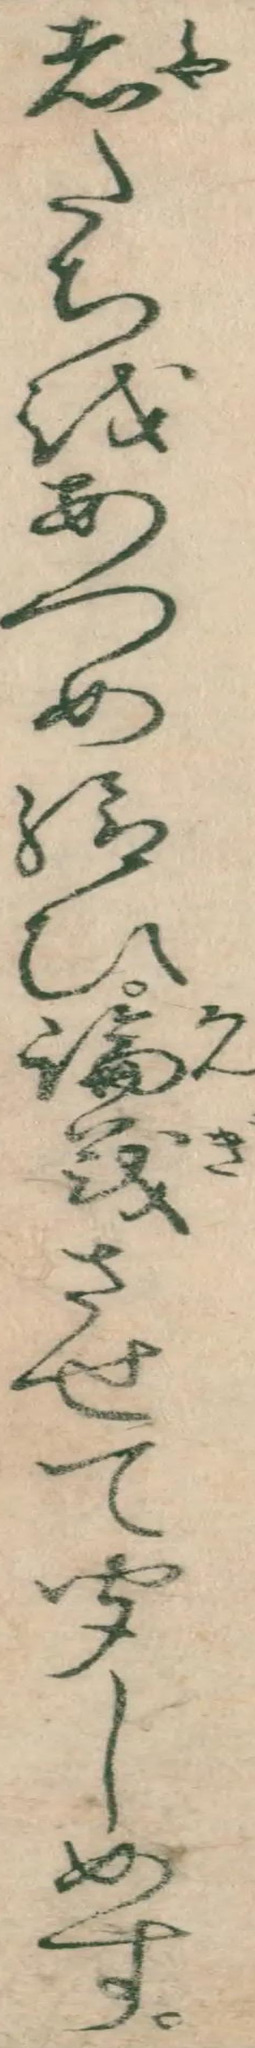者たちをあつめ給ひ。論義させて聞しめす。
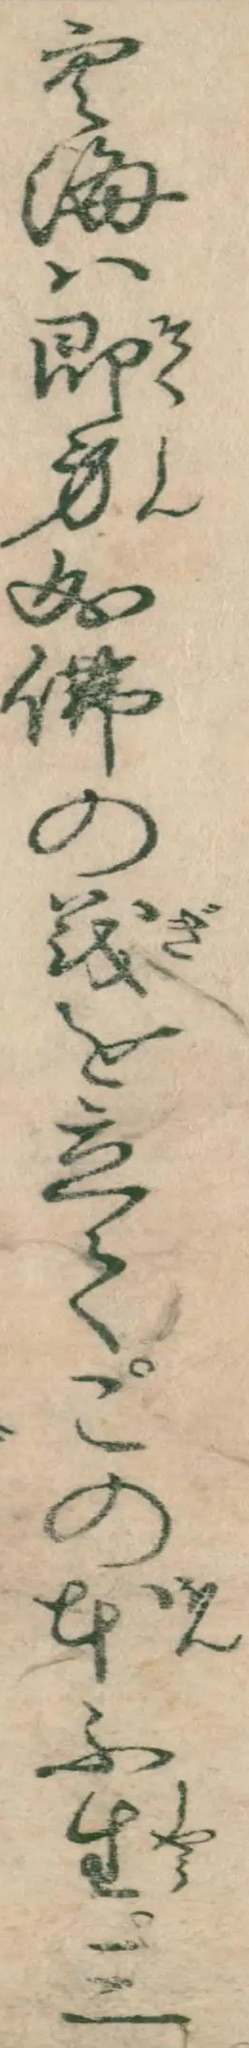空海は即身成仏の義を立て。この本ふ生三
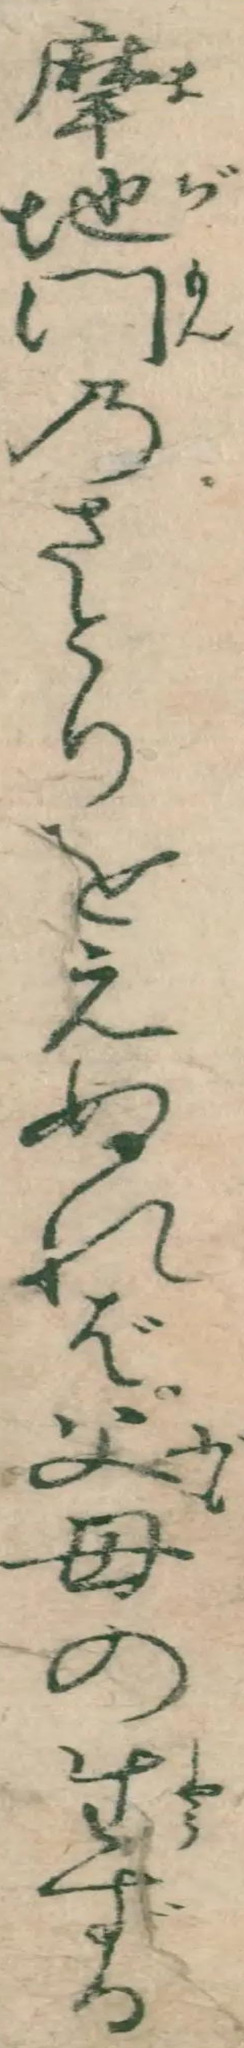摩地門のさとりをえぬれば。父母の生ずる

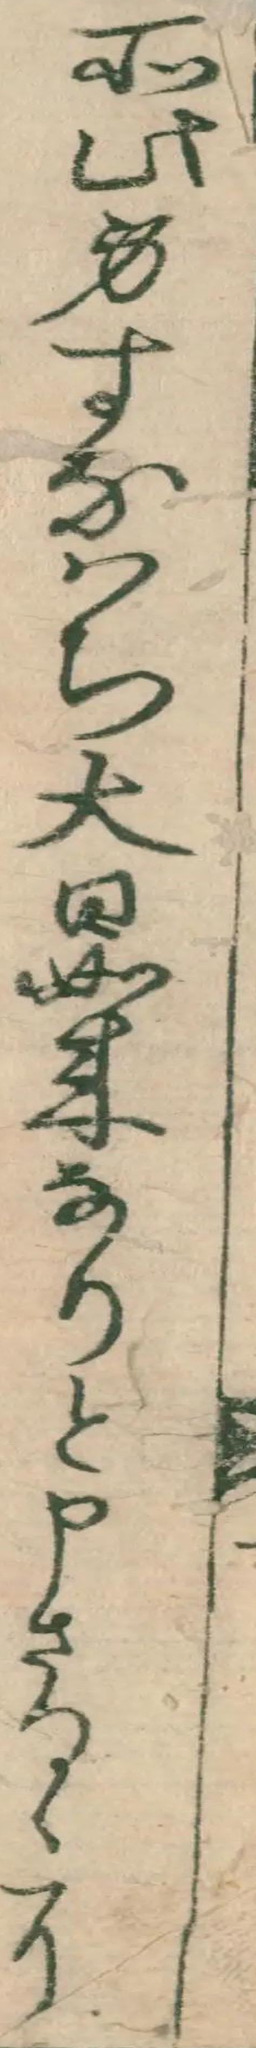所此身すなはち大日如来なりと申さるゝに
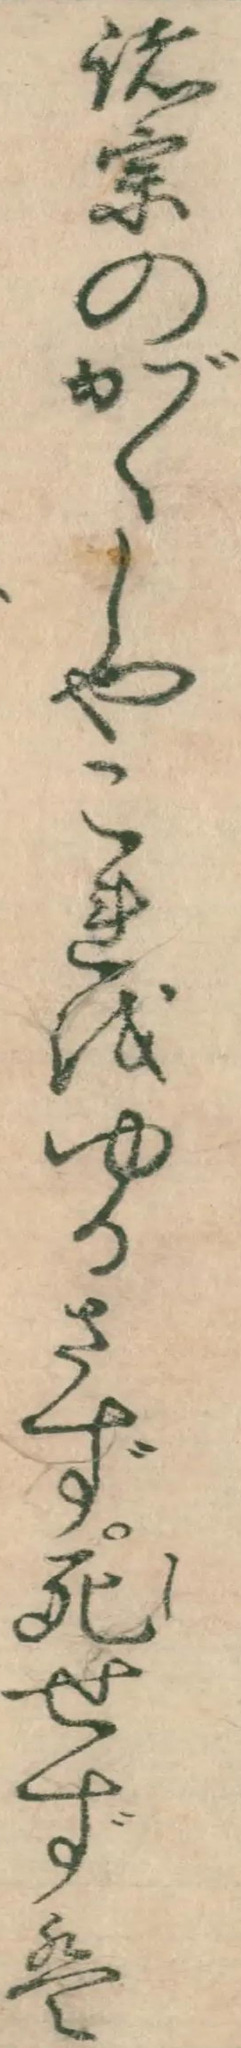諸宗のがくしやこれをゆるさず。死せずは
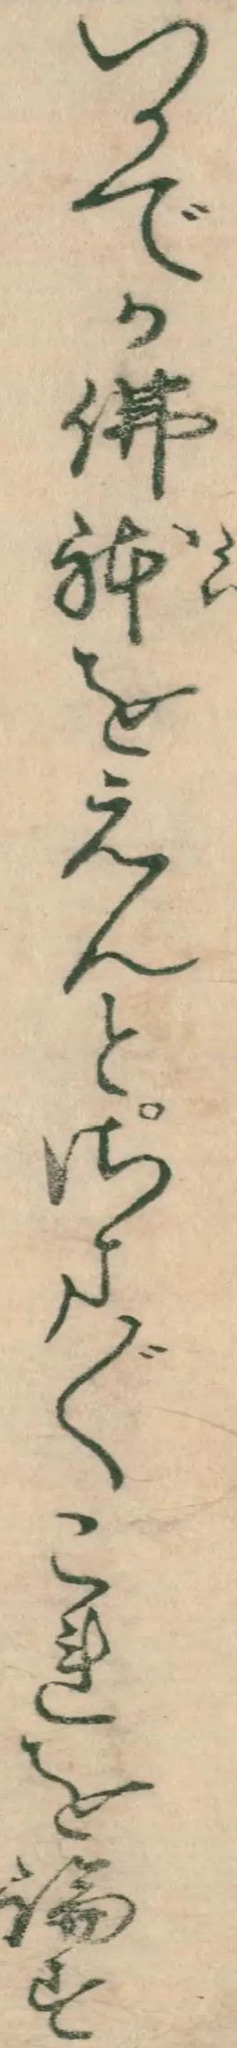いかでか仏体をえんと。さま〴〵これを論す
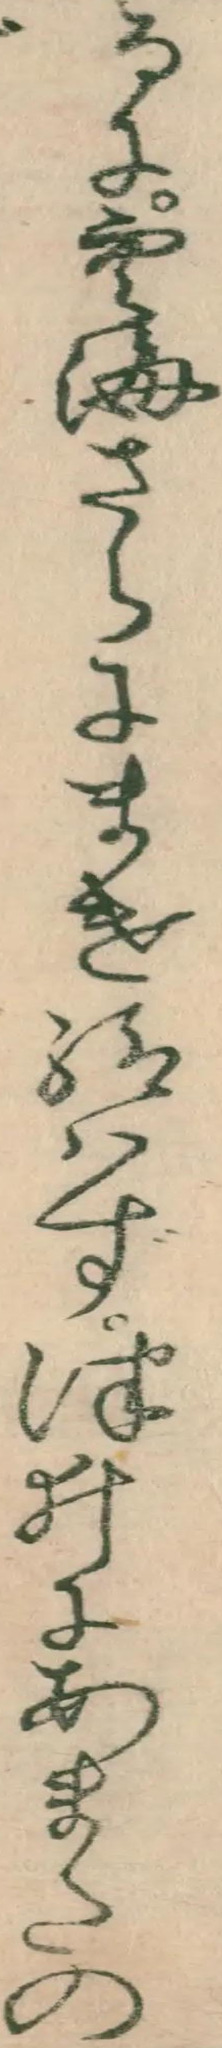るに。空海さらにまけ給はず。つゐにあまたの
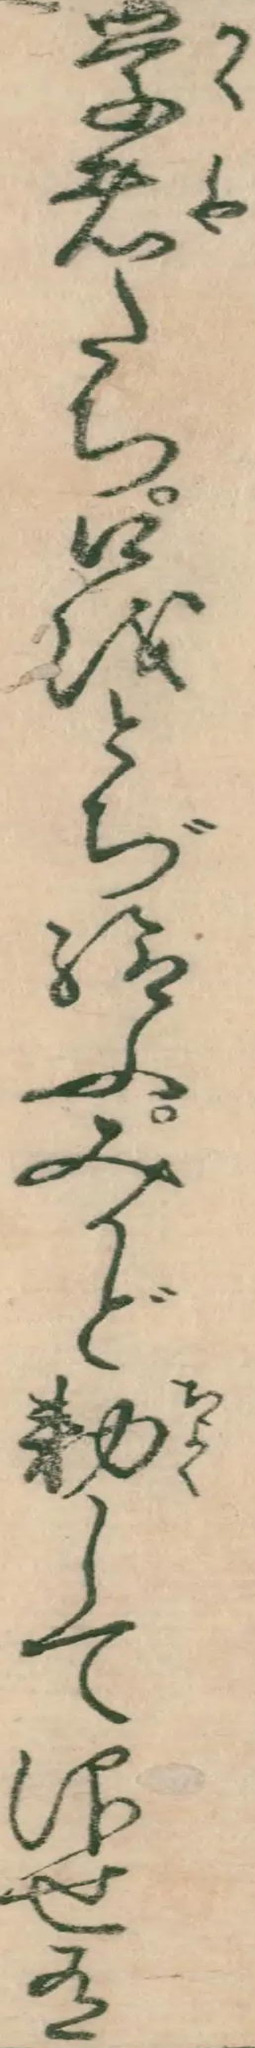学者たち。口をとぢ給ふ。みかど勅して仰せ有
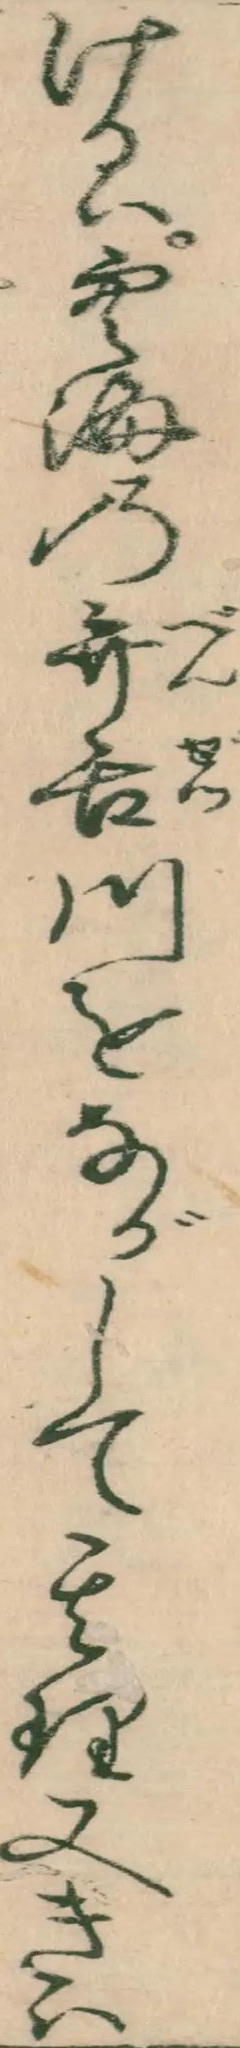けるは。空海の弁舌川をながして其理又きは
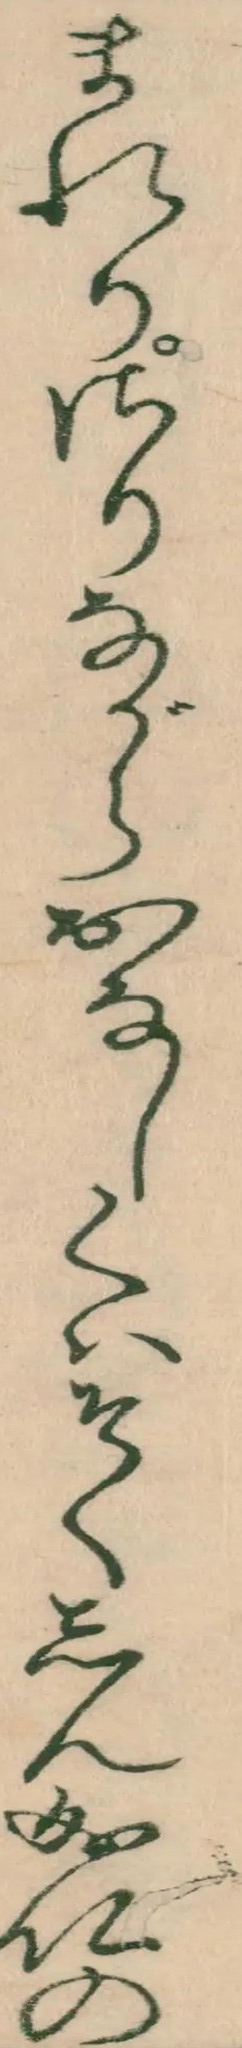まれり。さりながらかなしくはそくしん成仏の
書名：弘法大師御本地 3巻. [2]
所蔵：国立国会図書館 National Diet Library, JAPAN
